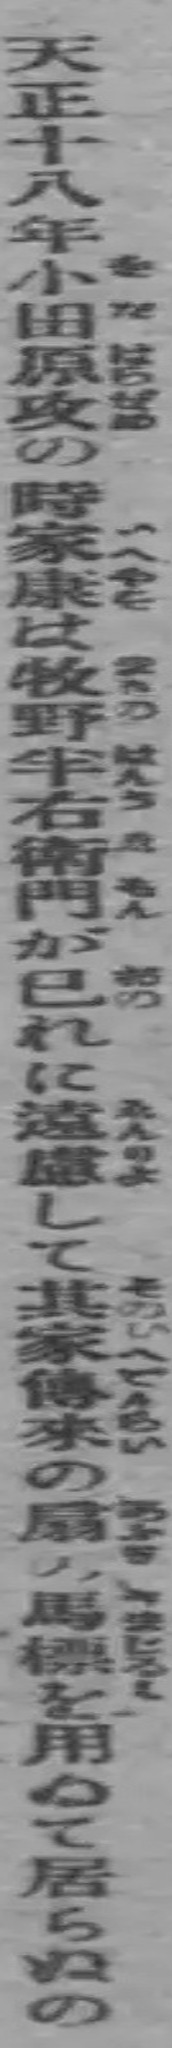天正十八年小田原攻の時家康は牧野半右衛門が巳れに遠慮して其家伝来の扇の馬標を用ゐて居らぬの
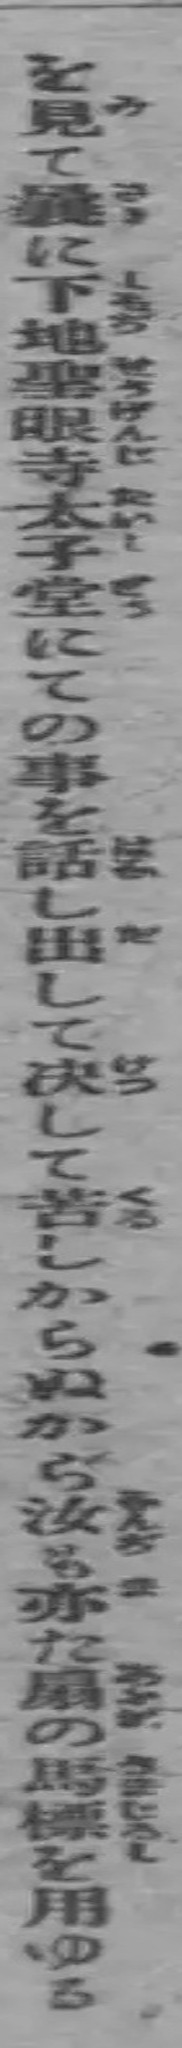を見て曩に下地聖眼寺太子堂にての事を話し出して決して苦しからぬから汝も亦た扇の馬標を用ゆる
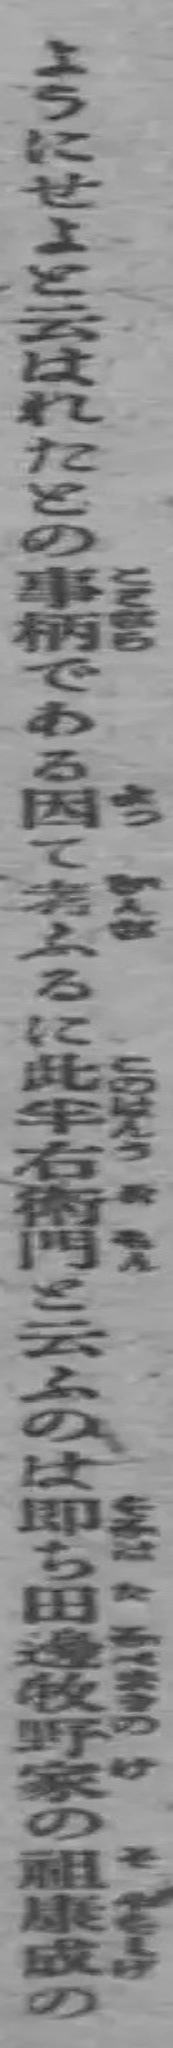ようにせよと云はれたとの事柄である因て考ふるに此半右衛門と云ふのは即ち田邉牧野家の祖康成の
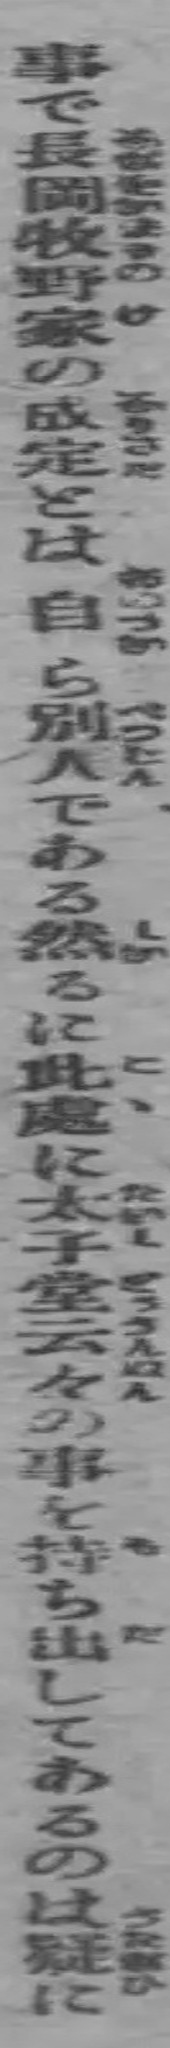事で長岡牧野家の成定とは自ら別人である然るに此処に太子堂云々の事を持ち出してあるのは疑に
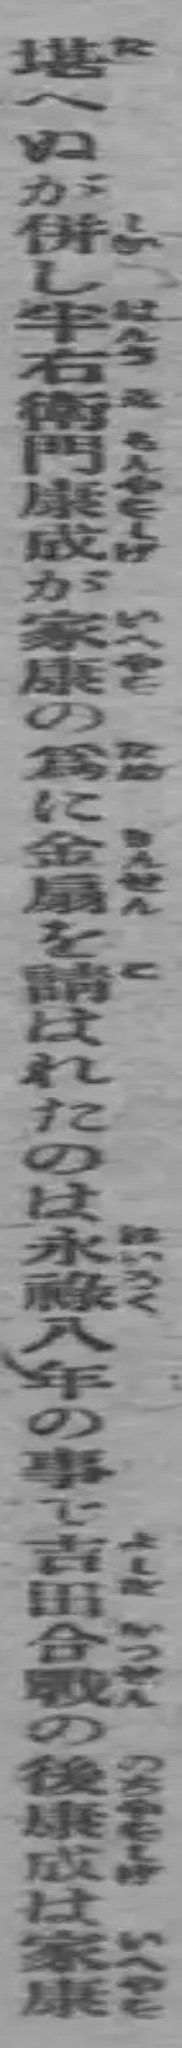堪へぬが併し半右衛門康成が家康の為に金扇を請はれたのは永禄八年の事で吉田合戦の後康成は家康
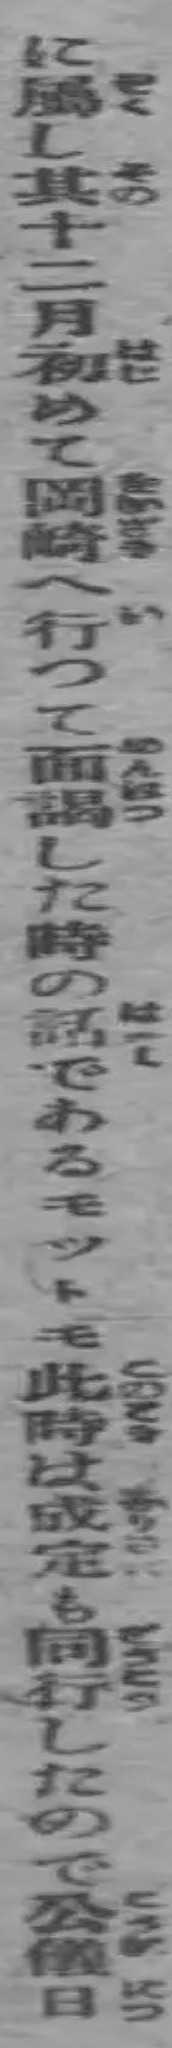に属し其十二月初めて岡崎へ行つて面謁した時の話であるモツトモ此時は成定も同行したので公儀日

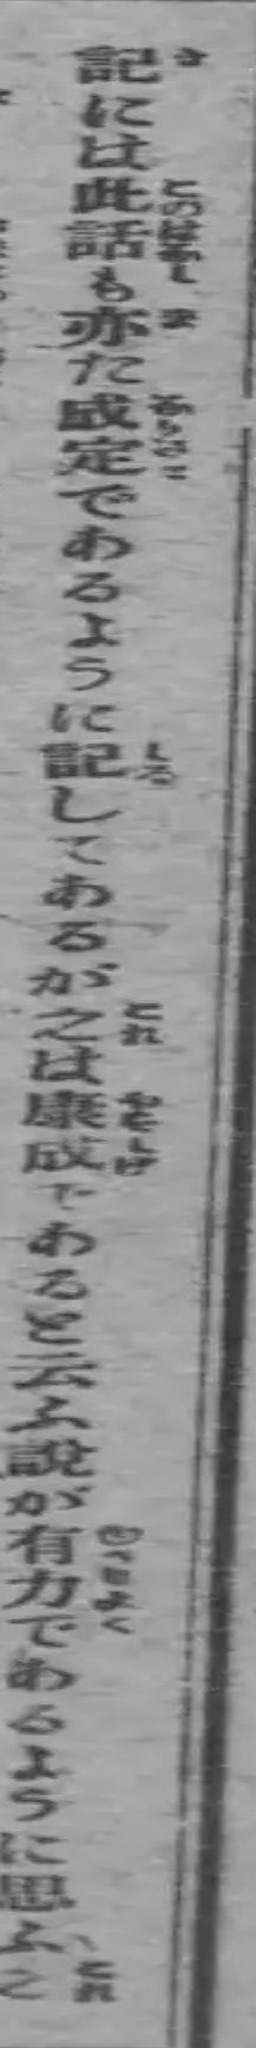記には此話も亦た成定であるように記してあるが之は康成であると云ふ説が有力であるように思ふ之
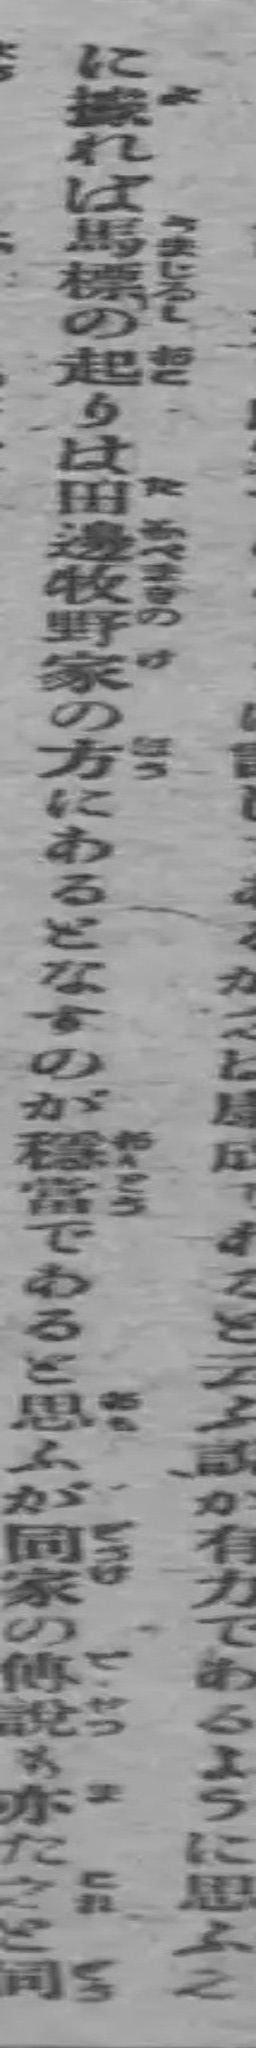に拠れば馬標の起りは田邉牧野家の方にあるとなすのが穏当であると思ふが同家の伝説も亦た之と同
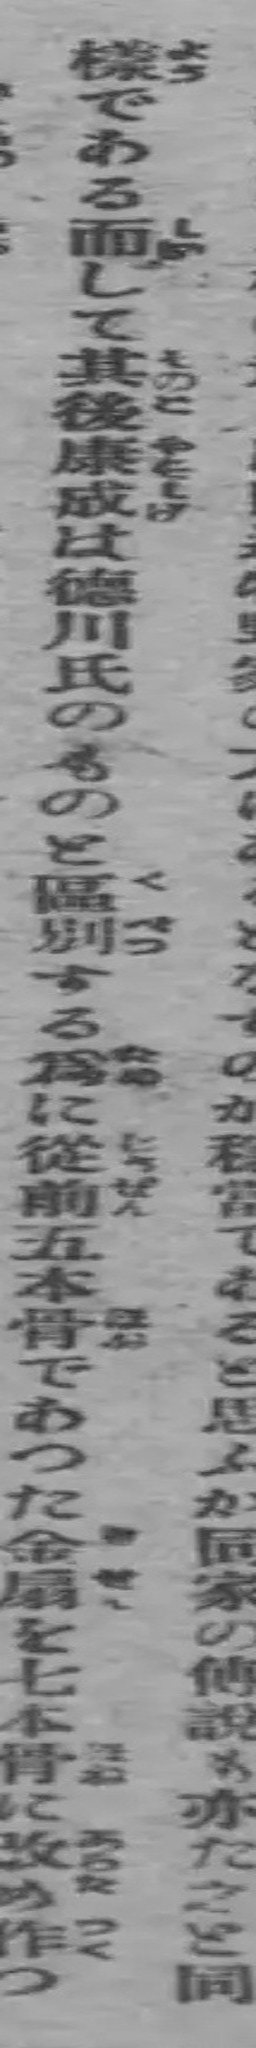様である而して其後康成は徳川氏のものと区別する為に従前五本骨であつた金扇を七本骨に改め作つ
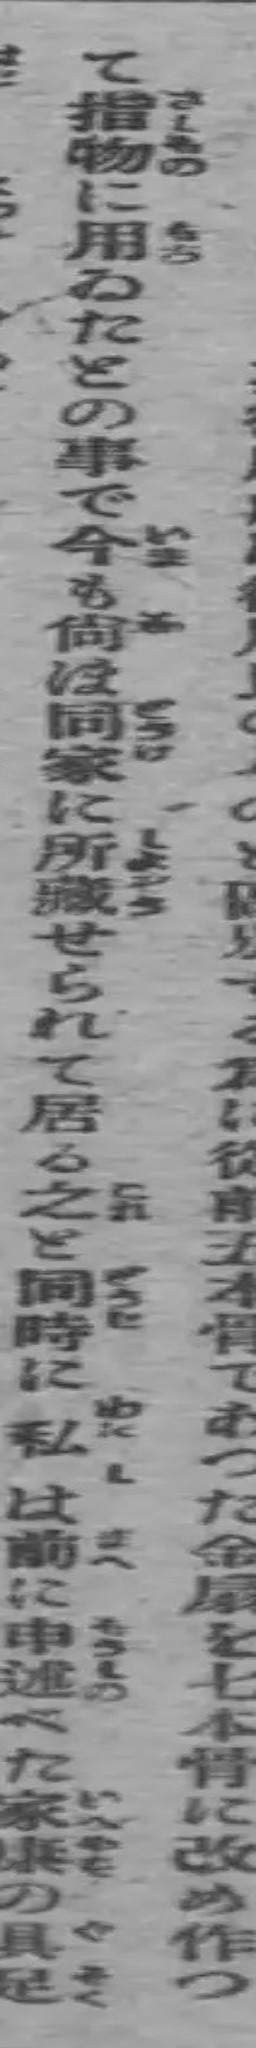て指物に用ゐたとの事で今も尚ほ同家に所蔵せられて居る之と同時に私は前に申述べた家康の具足
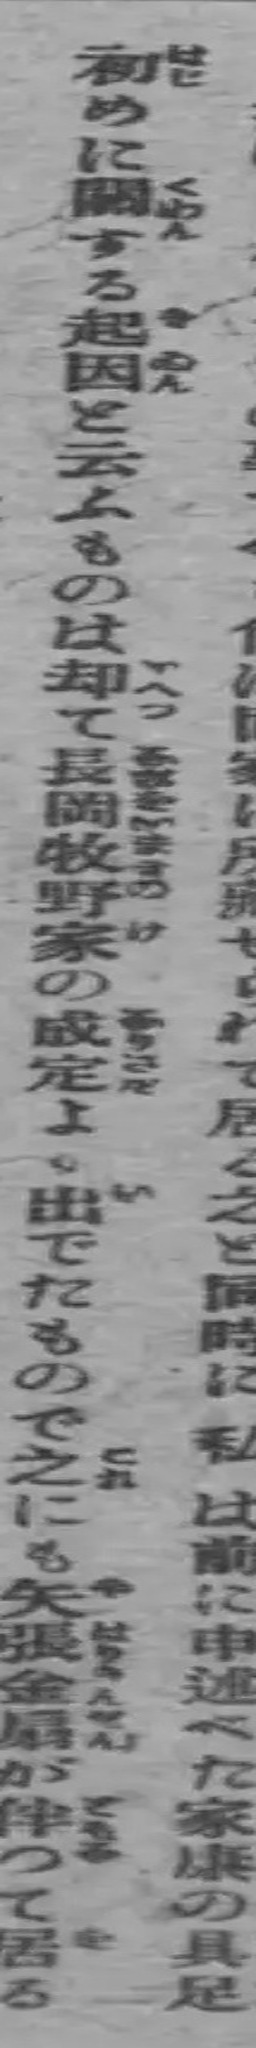初めに関する起因と云ふものは却て長岡牧野家の成定より出でたもので之にも矢張金扇が伴つて居る
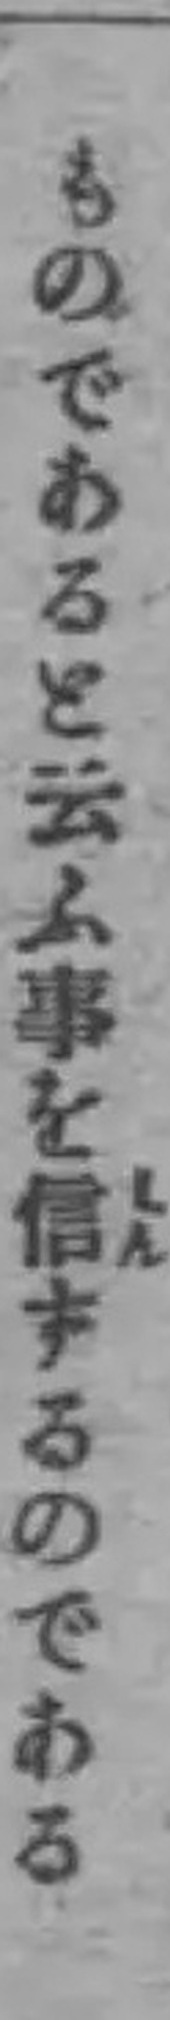ものであると云ふ事を信ずるのである
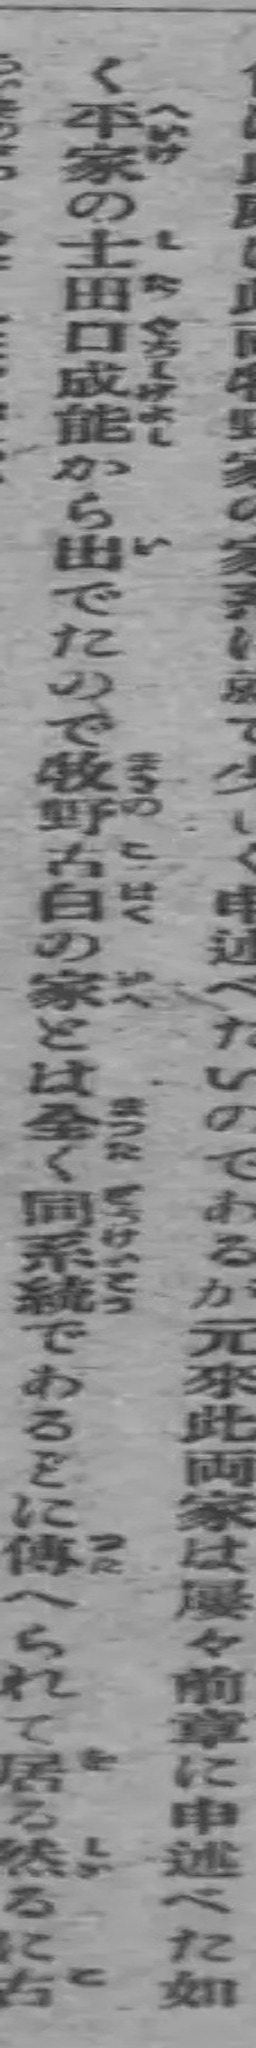の家系く平家の士田口成能から出でたので牧野古白の家とは全く同系統であることに伝へられて居る然るに古
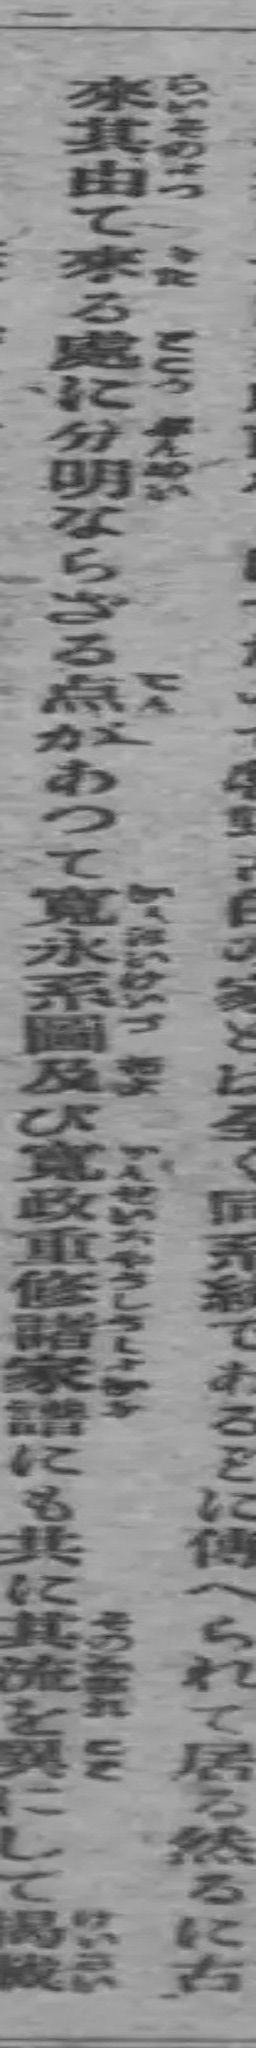来其由て来る処に分明ならざる点があつて寛永系図及び寛政重修諸家譜にも共に其流を異にして掲載
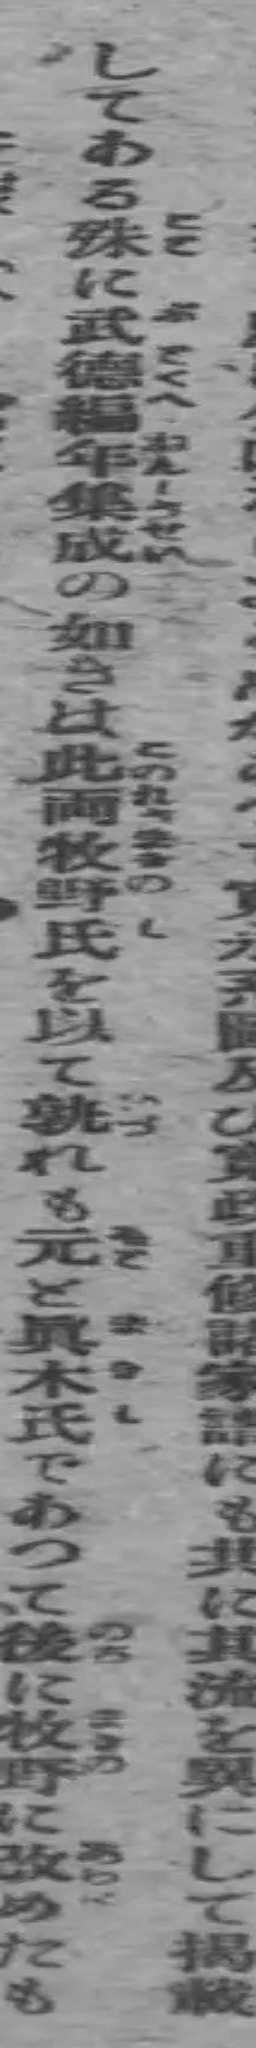してある殊に武徳編年集成の如きは此両牧野氏を以て孰れも元と眞木氏であつて後に牧野に改めたも
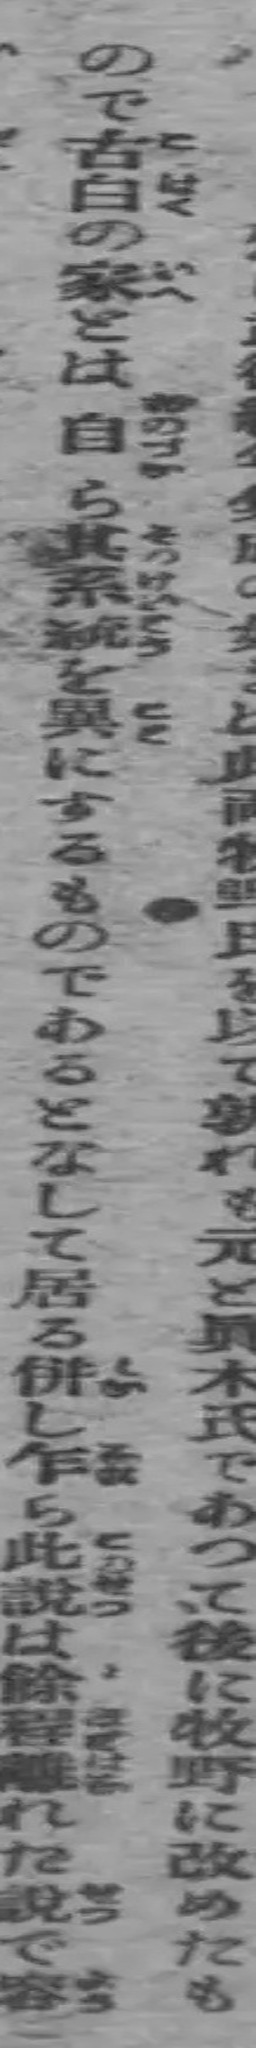ので古白の家とは自ら其系統を異にするものであるとなして居る併し乍ら此説は余程離れた説で容
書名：豊橋市史談
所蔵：国立国会図書館 National Diet Library, JAPAN
